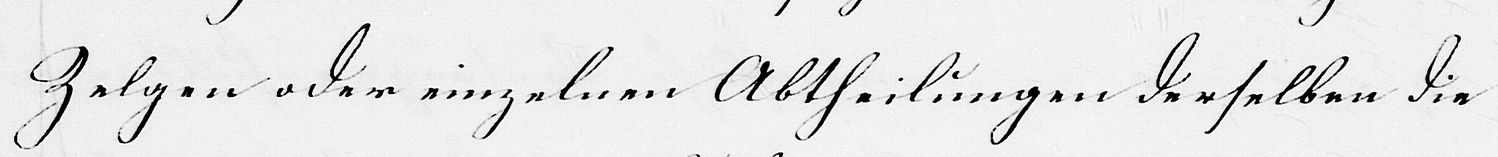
Zelgen oder einzelnen Abtheilungen derselben die
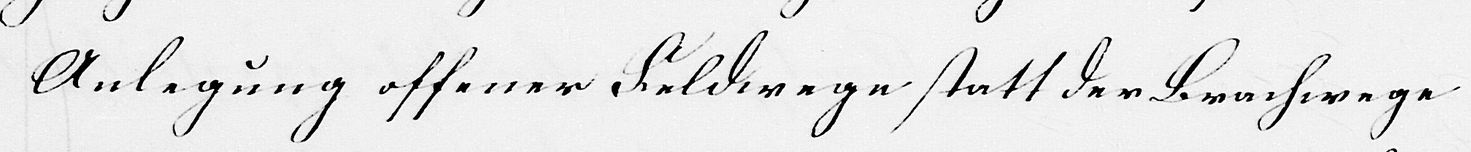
Anlegung offener Feldwege statt der Brachwege
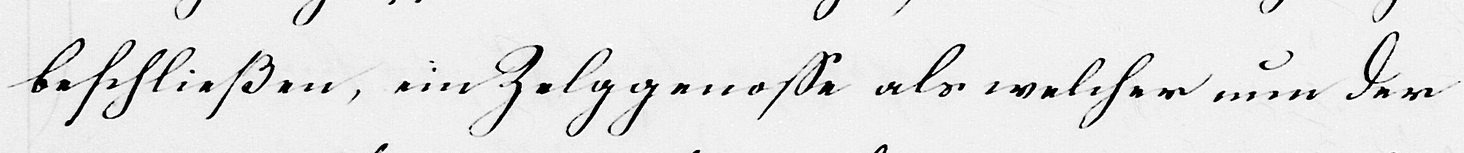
beschließen, ein Zelggenoße als welcher nun der
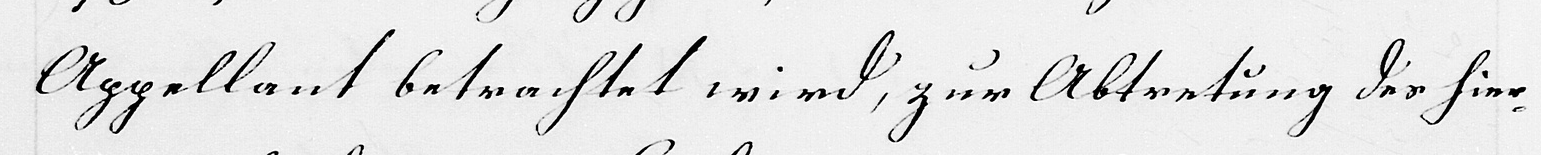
Appellant betrachtet wird, zur Abtretung des hier¬
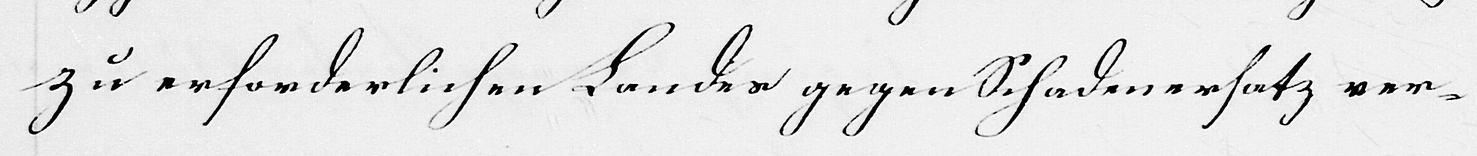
zu erforderlichen Landes gegen Schadenersatz ver¬
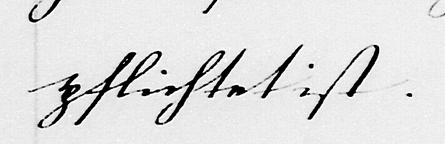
pflichtet ist.
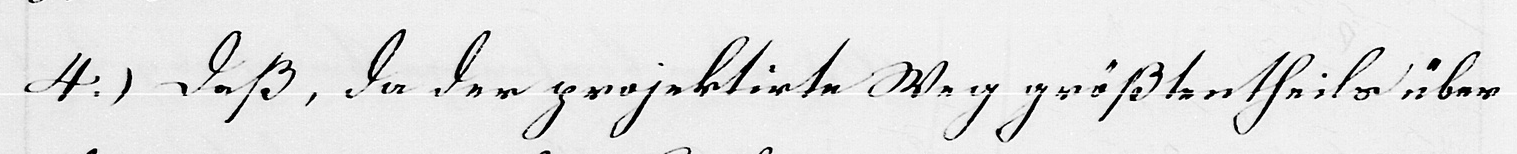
4.) Daß, da der projektirte Weg größtentheils über
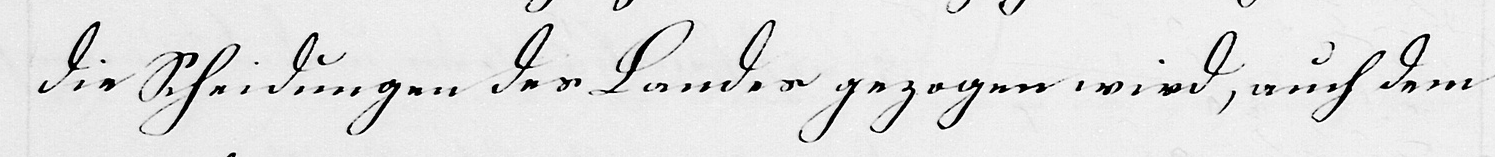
die Scheidungen des Landes gezogen wird, auch dem
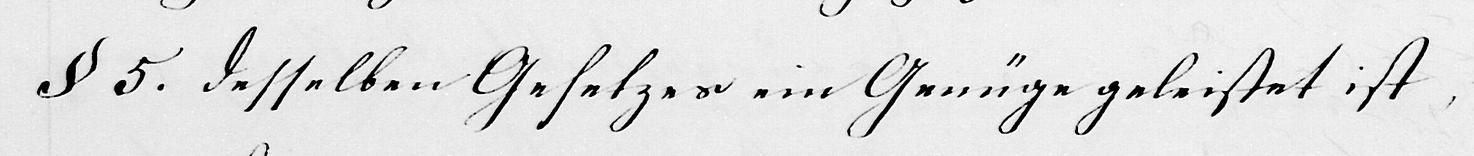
§ 5. desselben Gesetzes ein Genüge geleistet ist.
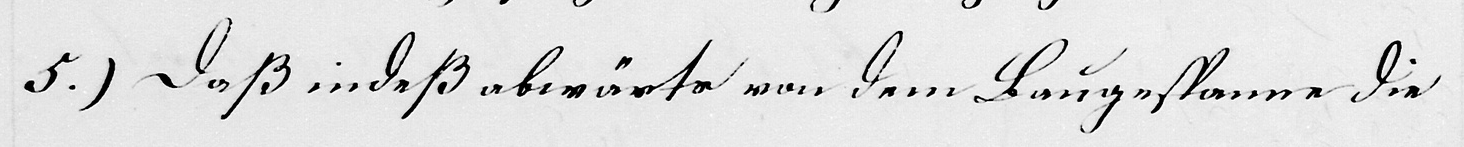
5.) Daß indeß abwärts von dem Baugespanne die
